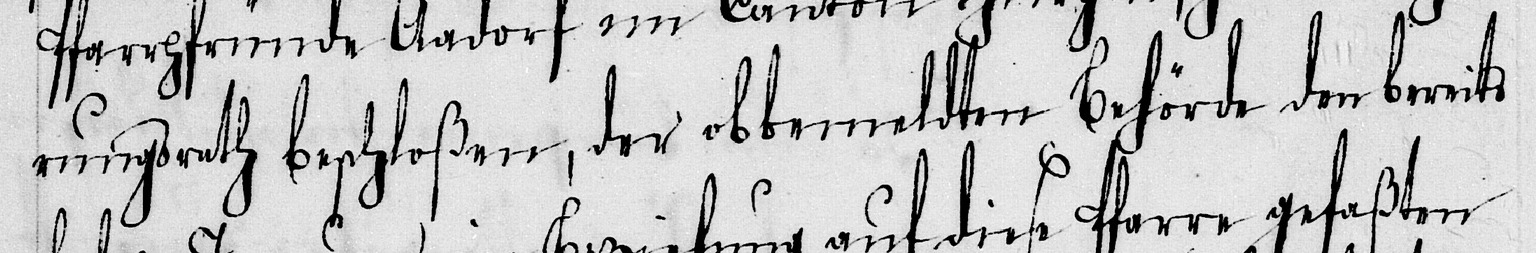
erungsrath beschloßen, der obbemeldten Behörde den bereits
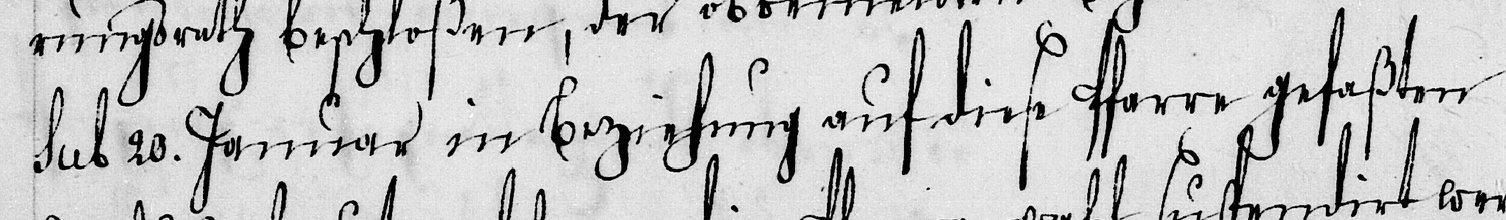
sub 20. Januar in Beziehung auf diese Pfarre gefaßten
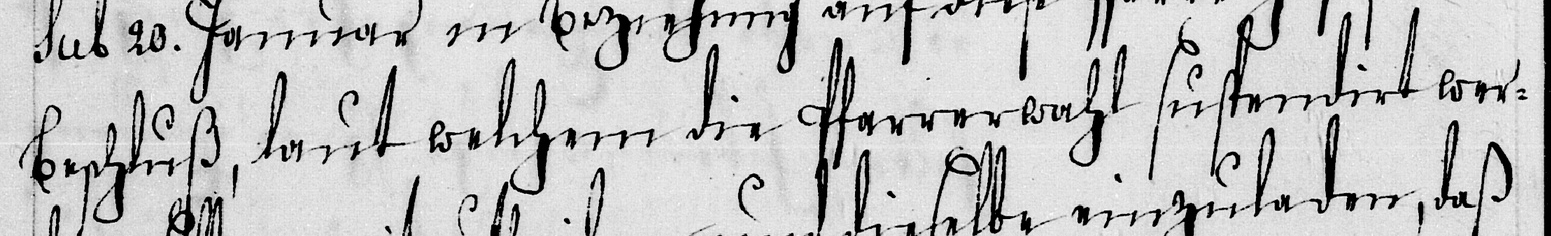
Beschluß, laut welchem die Pfarrerwahl suspendirt wer¬
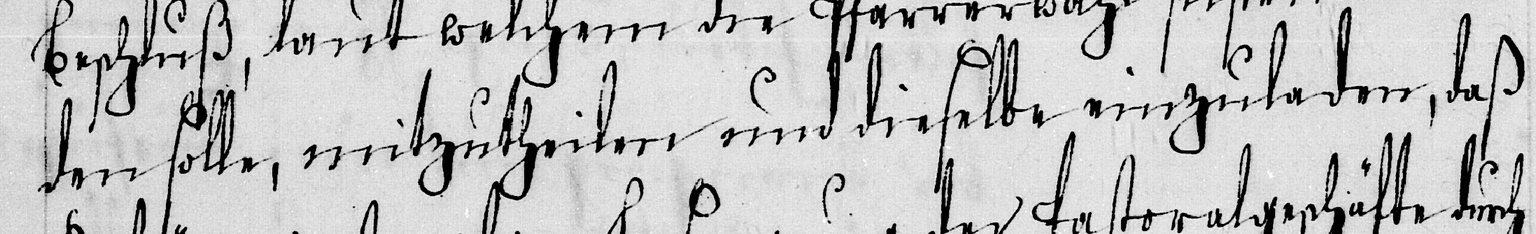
den solle, mitzutheilen und dieselbe einzuladen, daß
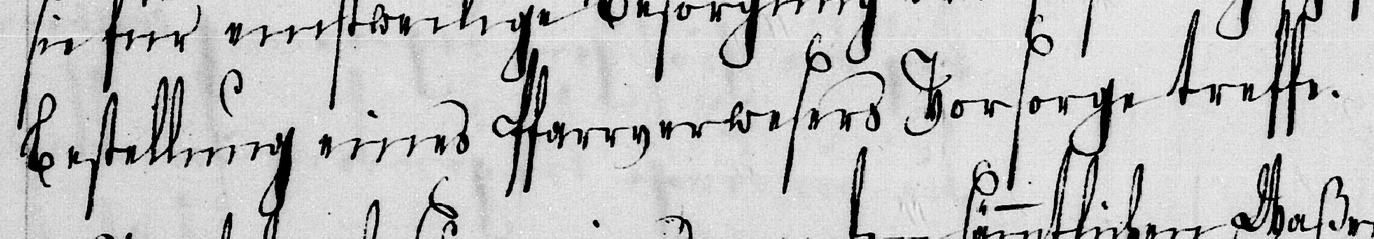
Bestellung eines Pfarrverwesers Vorsorge treffe.
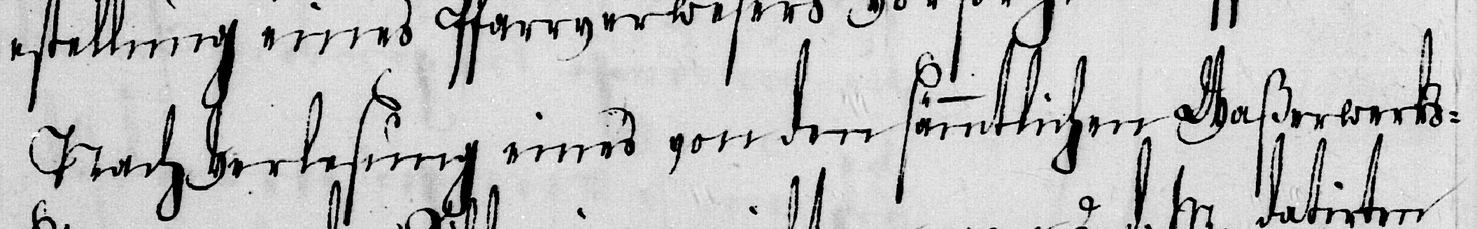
Nach Verlesung eines von den sämmtlichen Waßerwerks¬
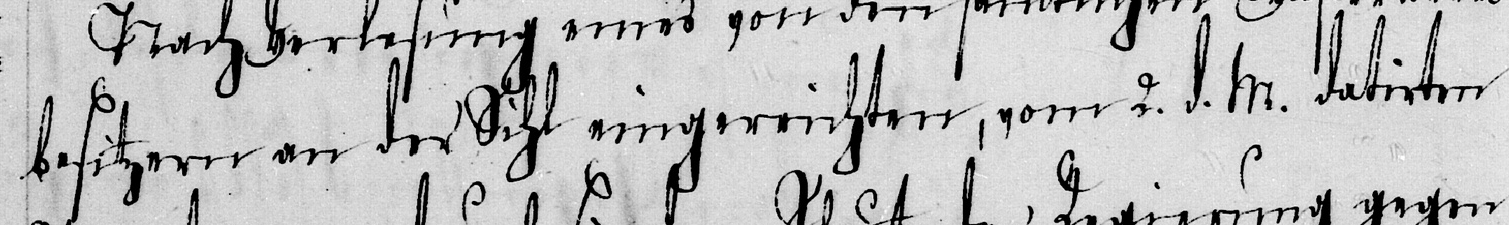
besitzern an der Sihl eingereichten, vom 2. d. M. datirten
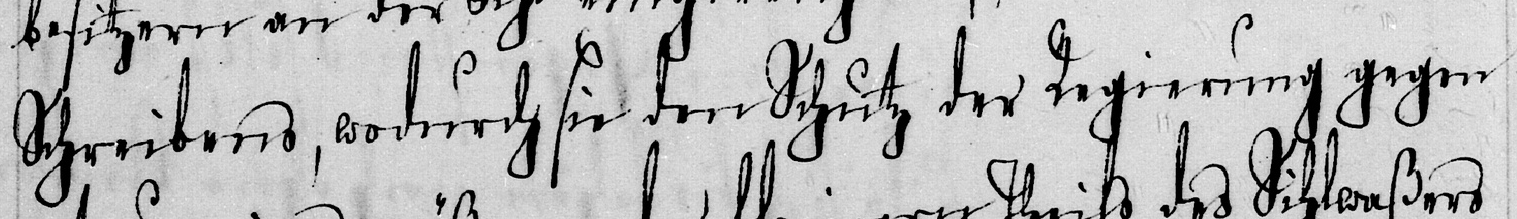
Schreibens, wodurch sie den Schutz der Regierung gegen
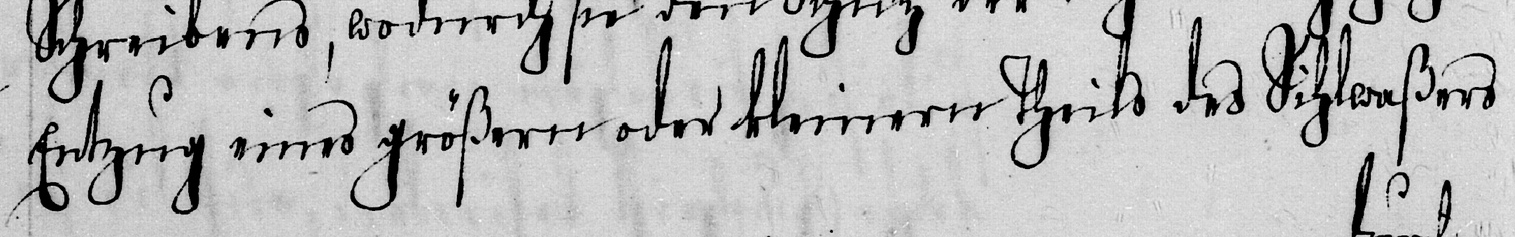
Entzug eines grösseren oder kleineren Theils des Sihlwaßers
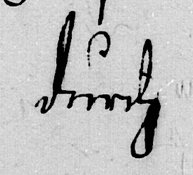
durch
